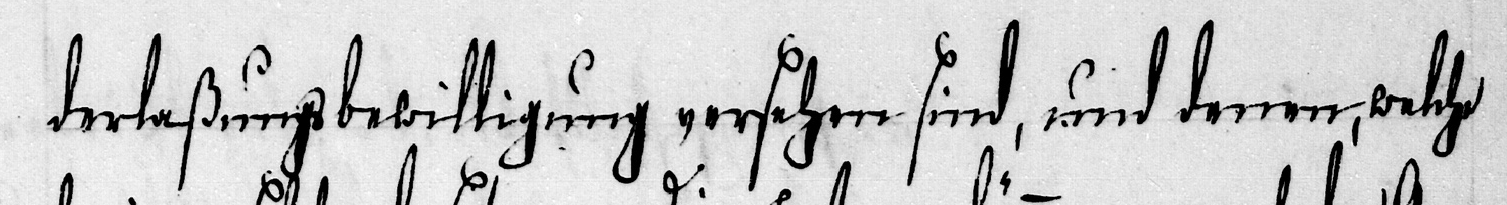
derlaßungsbewilligung versehen sind, und denen, welche
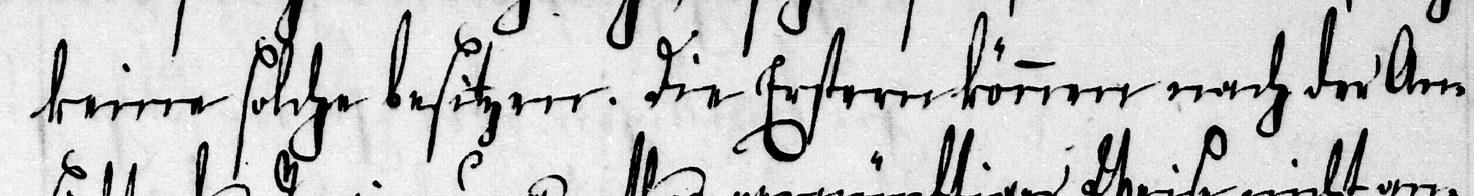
keine solche besitzen. Die Erstern können nach der An¬
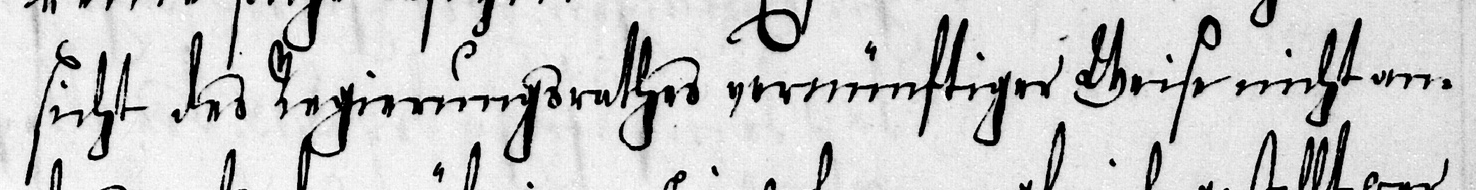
sicht der Regierungsrathes vernünftiger Weise nicht an¬
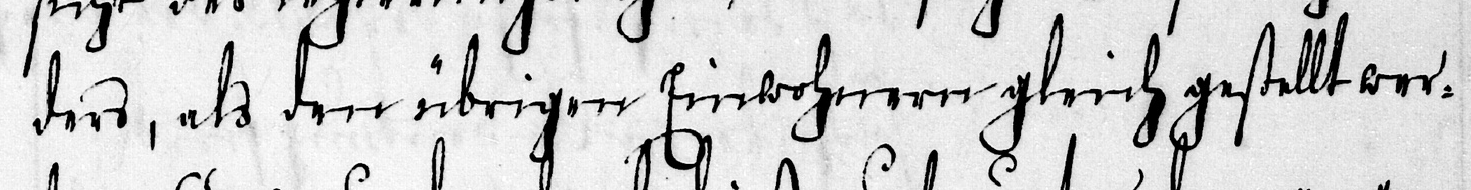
ders, als den übrigen Einwohnern gleich gestellt wer¬
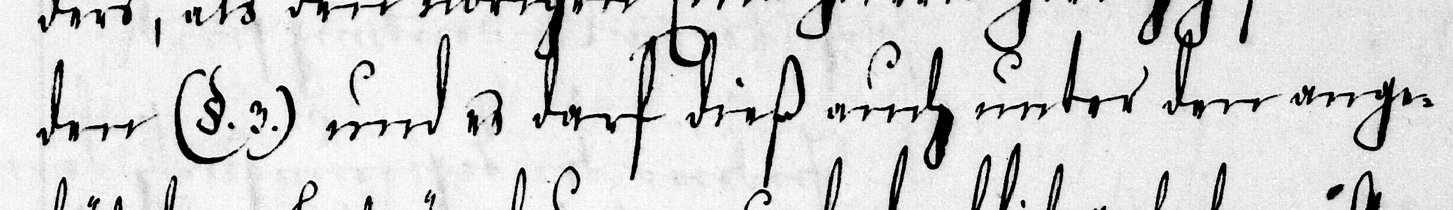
den (§. 3.) und es darf dieß auch unter den ange¬
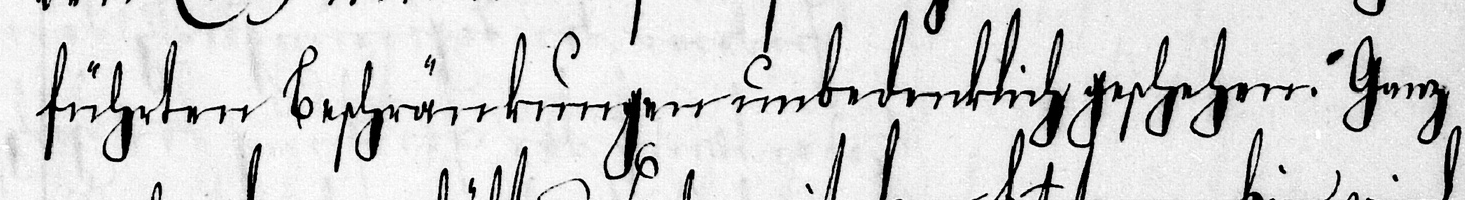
führten Beschränkungen unbedenklich geschehen. Ganz
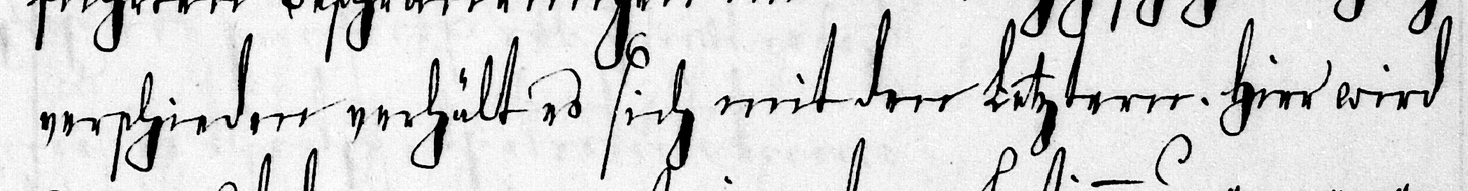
verschieden verhält es sich mit den Letztern. Hier wird
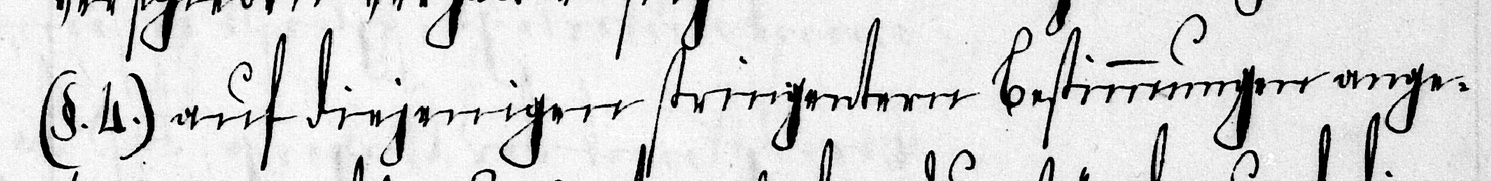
(§. 4.) auf diejenigen stringenten Bestimmungen ange¬
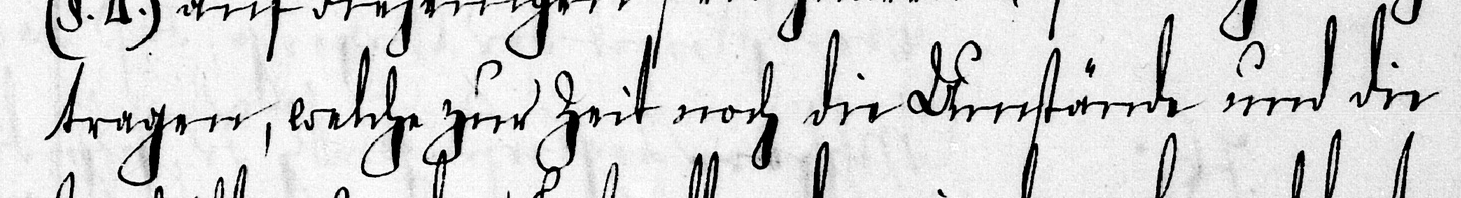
tragen, welche zur Zeit noch die Umstände und die
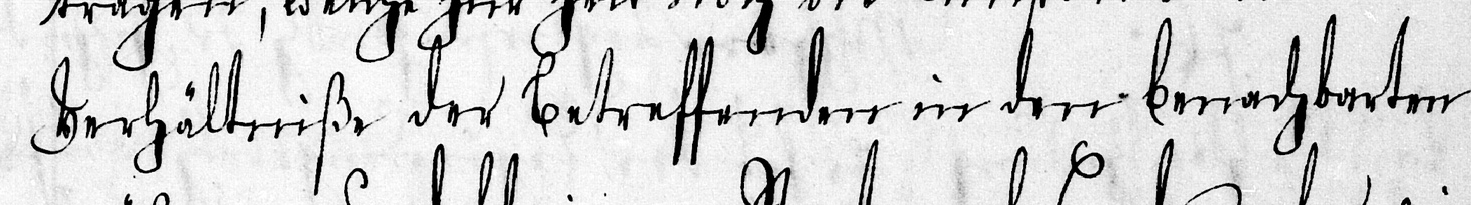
Verhältniße der Betreffenden in den benachbarten
